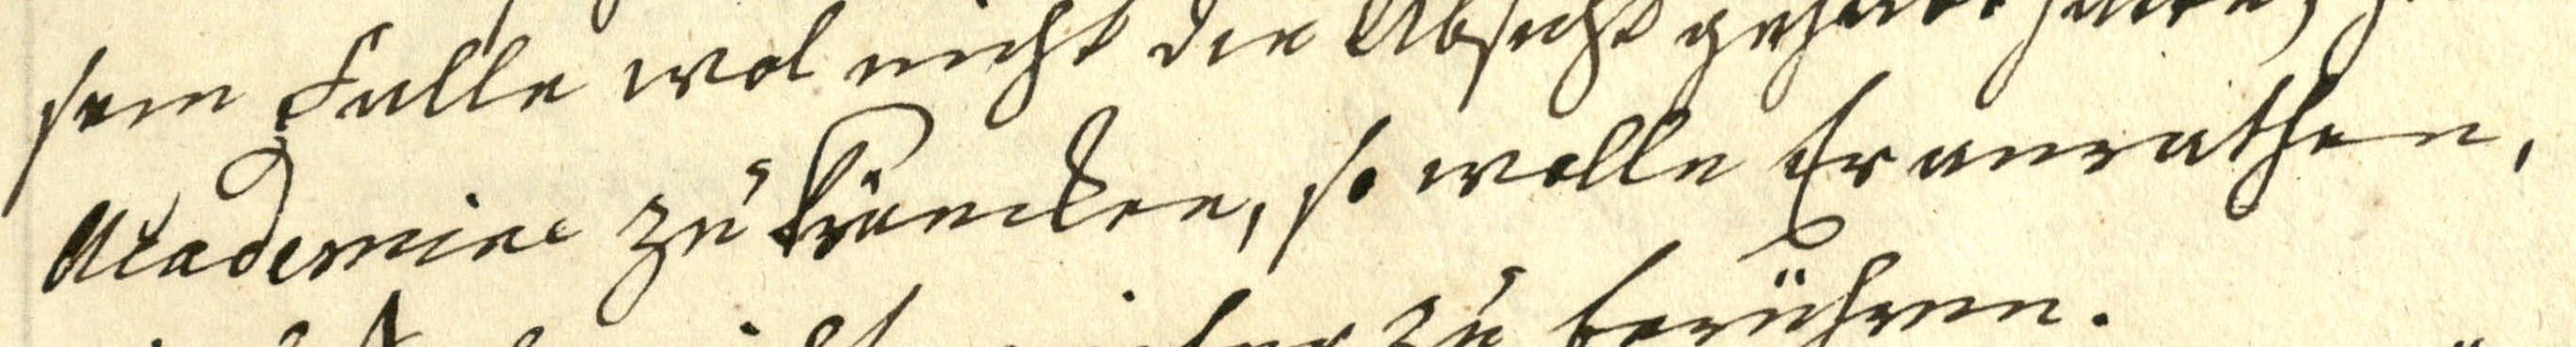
Academiae zu kräncken, so wolle Er anrathen,
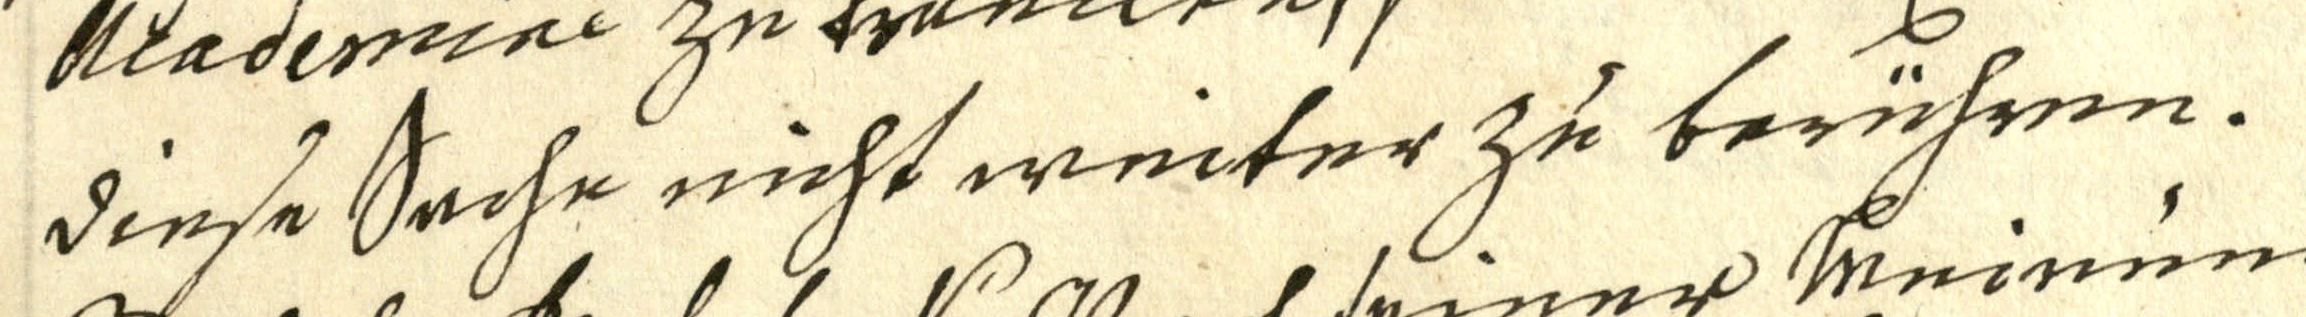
diese Sache nicht weiter zu berühren.
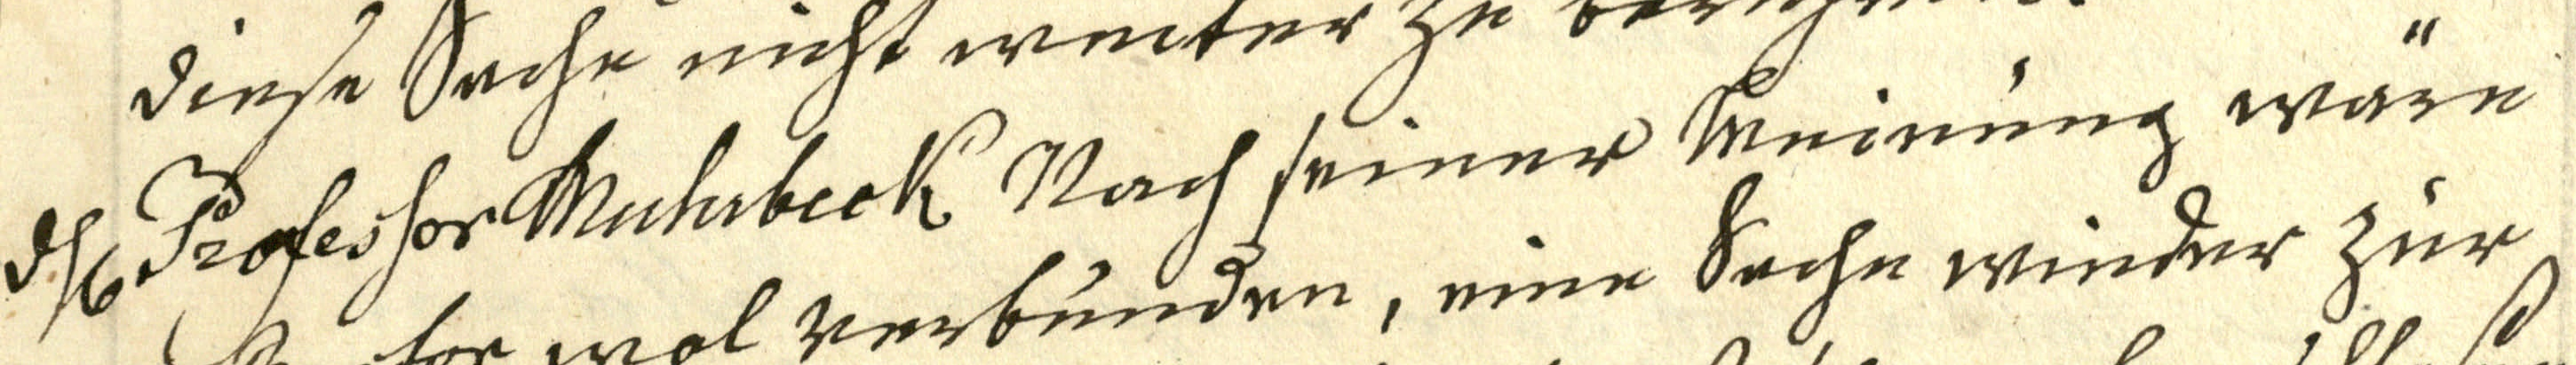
dh. Professor Muhrbeck. Nach seiner Meinung wäre
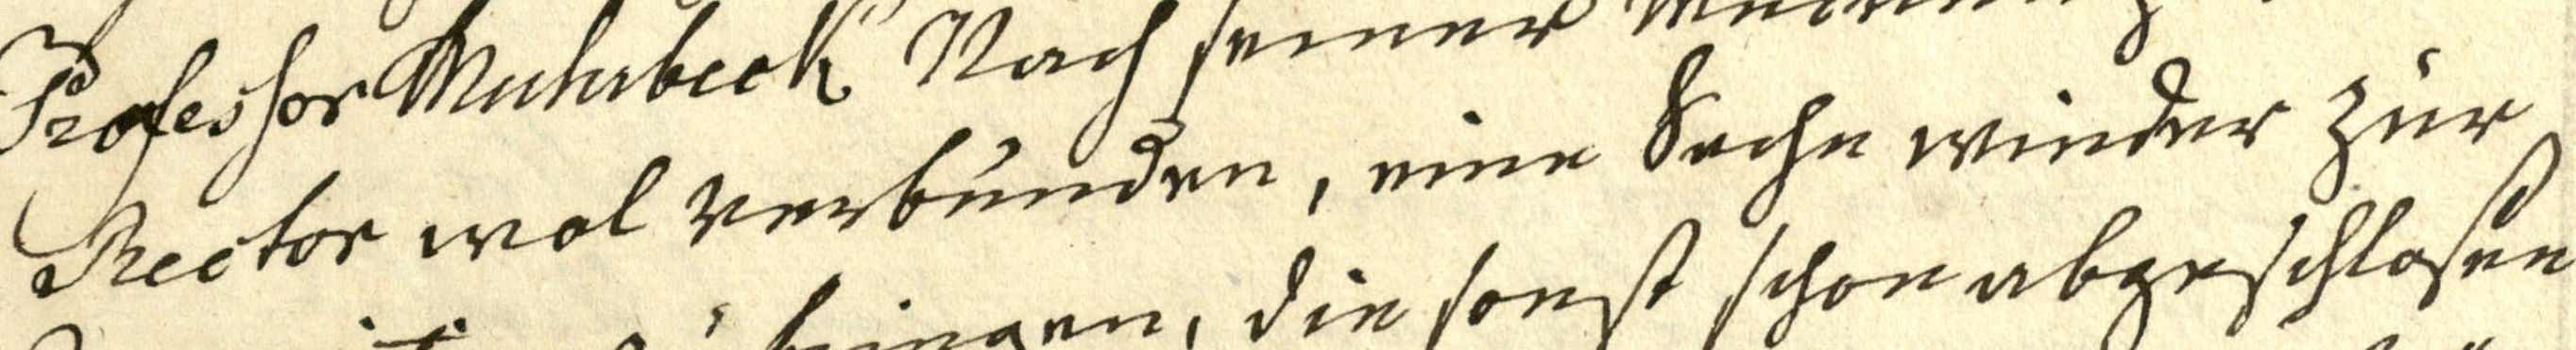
Rector wol verbunden, eine Sache wieder zur
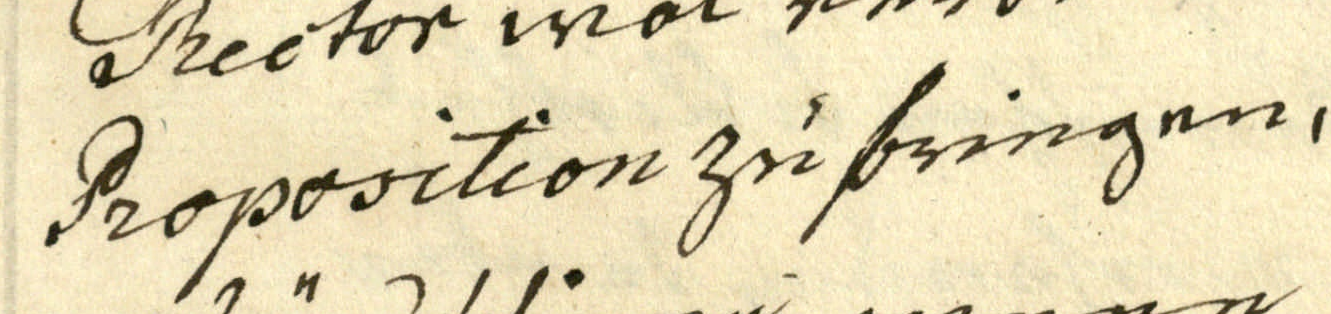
Proposition zu bringen, die sonst schon abgeschloßen
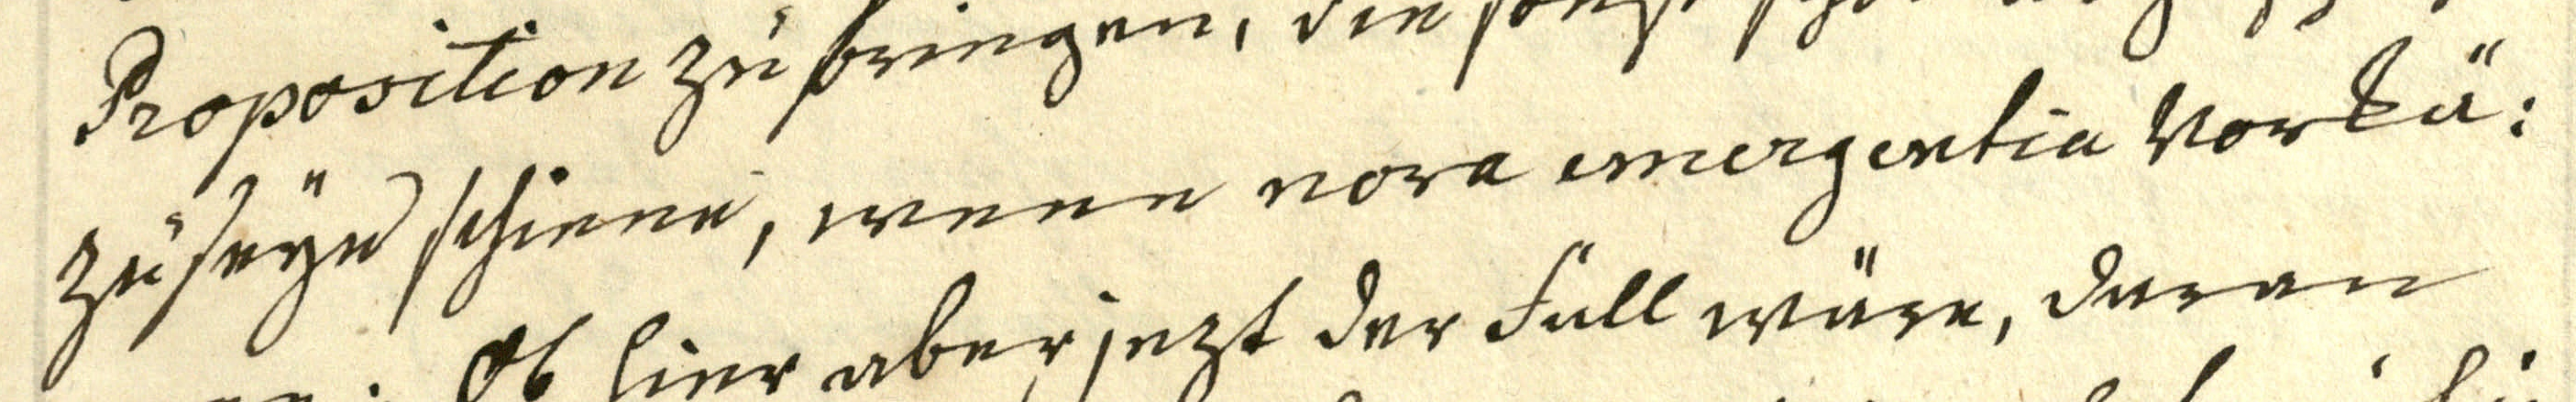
zu seÿn schiene, wenn nova emergentia vorkä¬
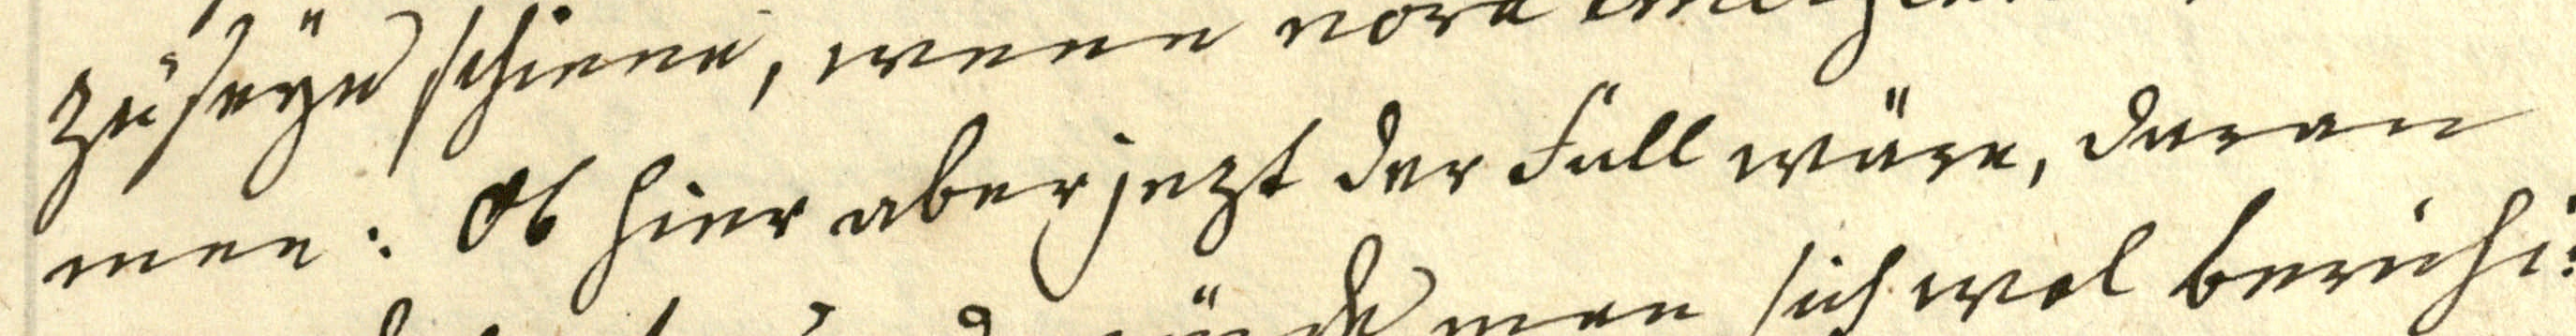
men: Ob hier aber jezt der Fall wäre, daran
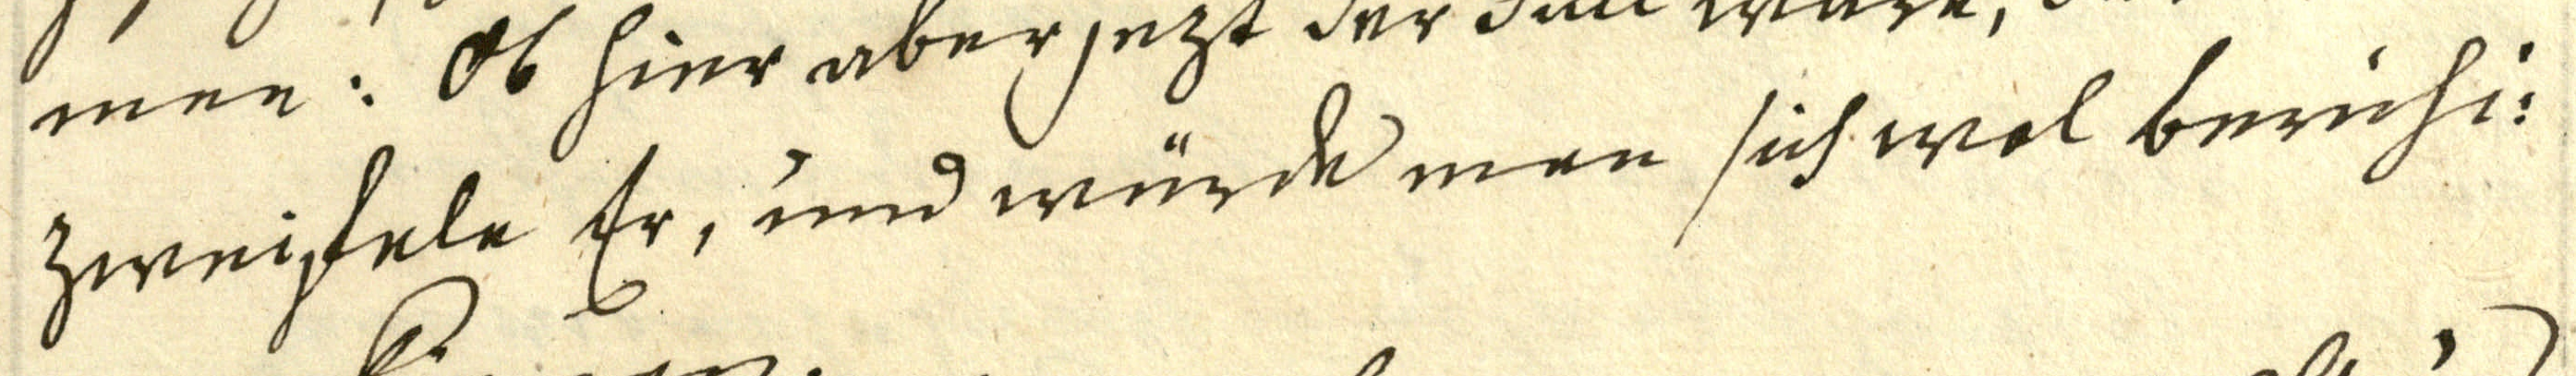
zweifele Er, und würde man sich wol beruhi¬
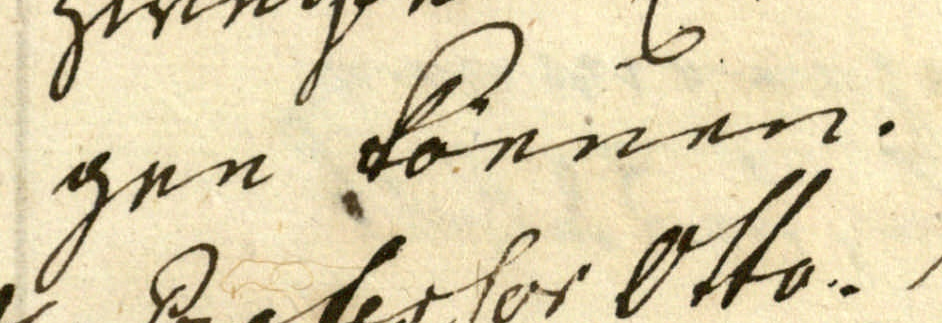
gen können.
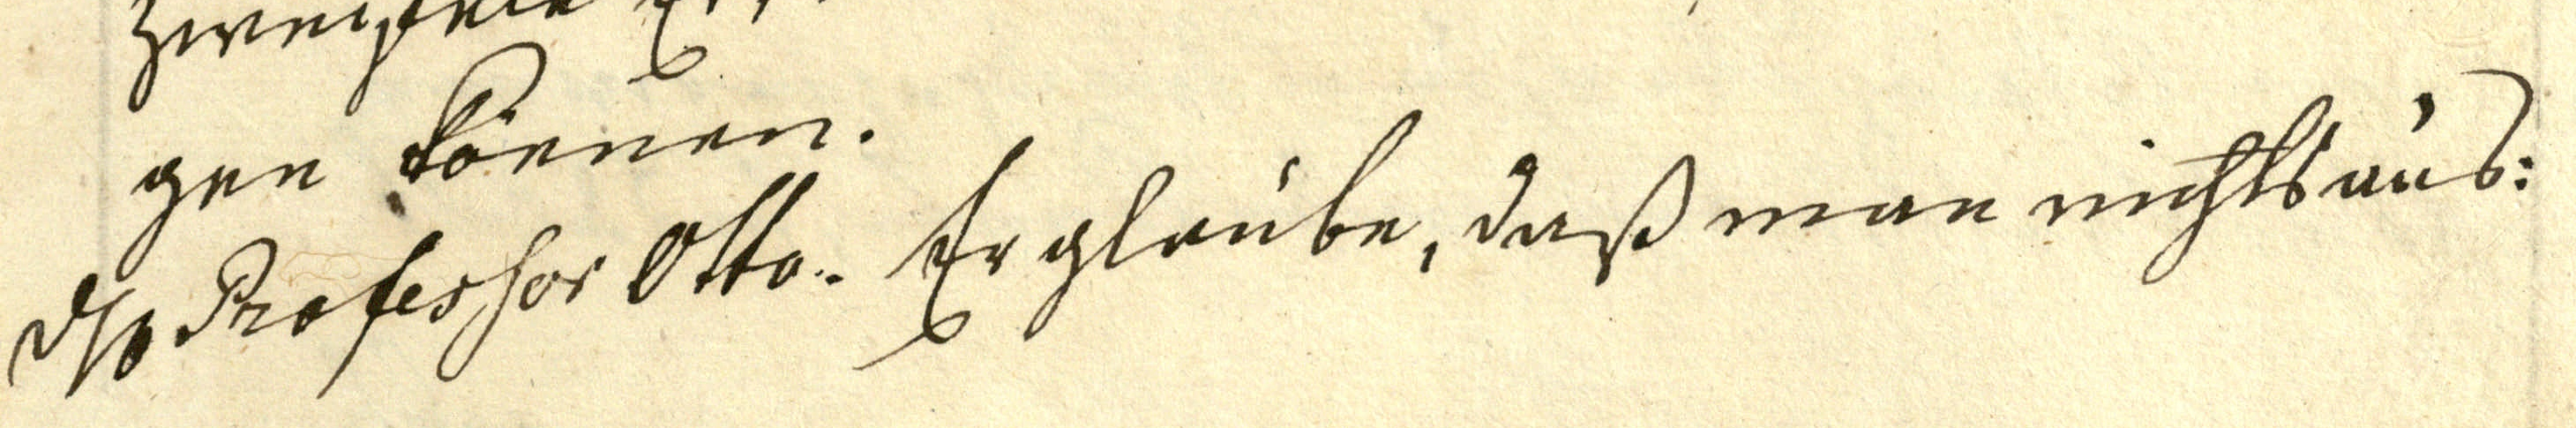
dh Professor Otto. Er glaube, daß man nichts aus¬
